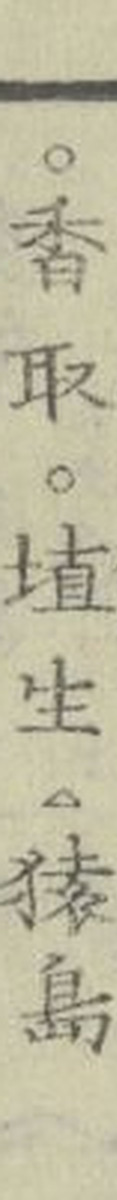○香取○埴生△猿島
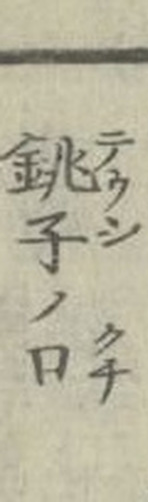銚子ノ口
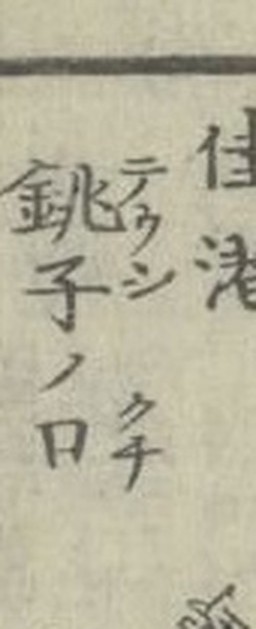銚子ノ口
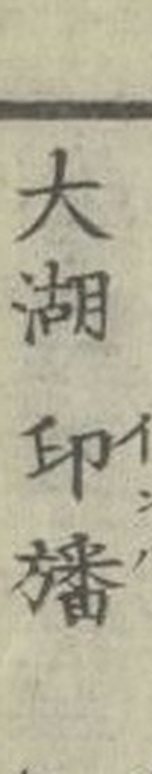大湖印旛
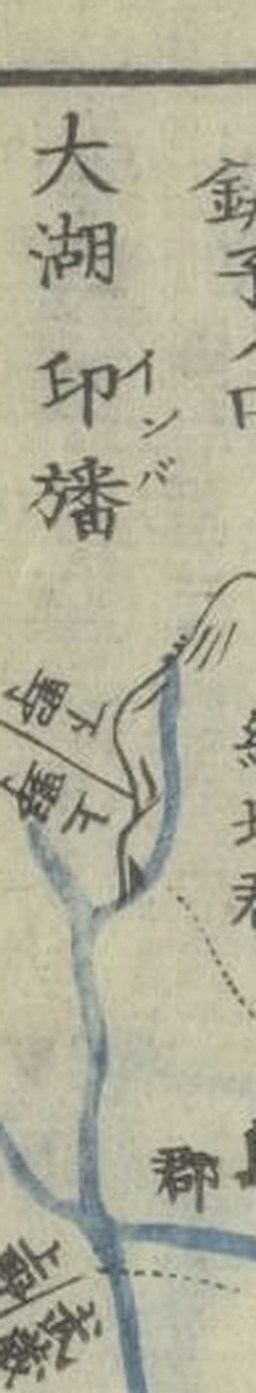大湖印旛

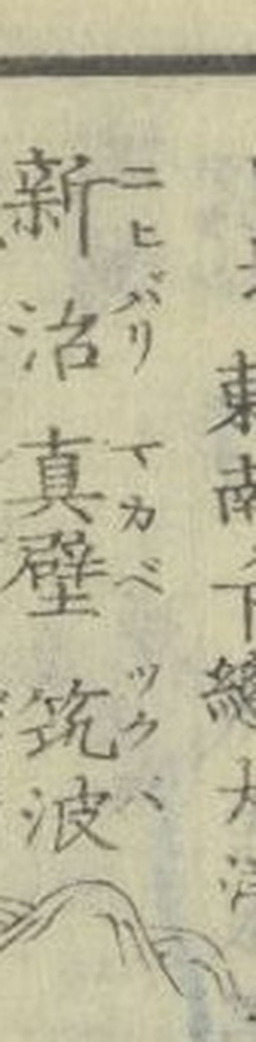新治真壁筑波
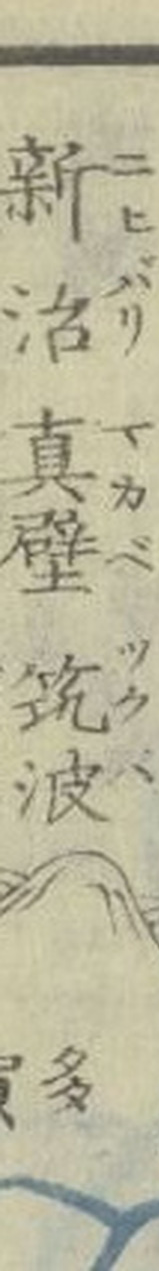新治真壁筑波
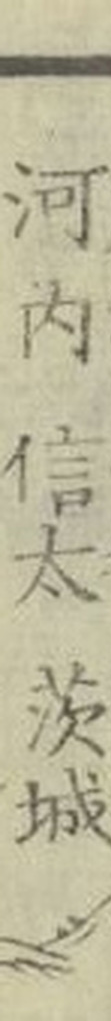河内信太茨城
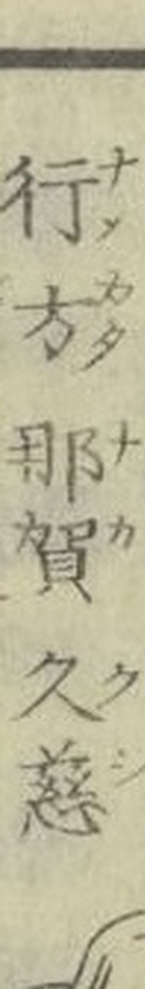行方那賀久慈
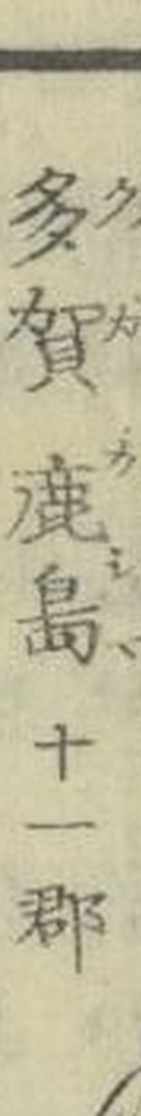多賀鹿島十一郡
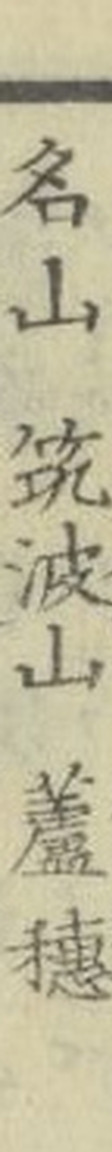名山筑波山蘆穂
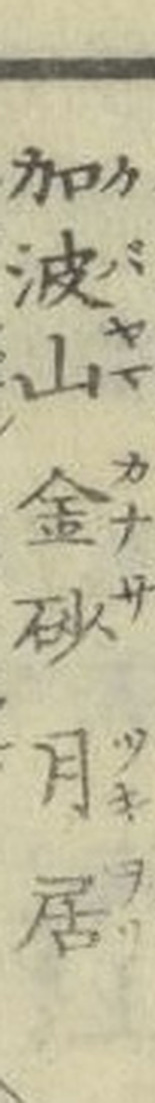加波山金砂月居
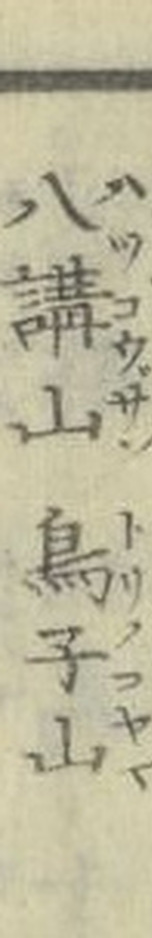八講山鳥子山
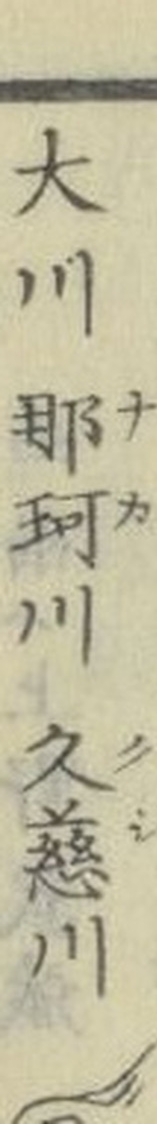大川那珂川久慈川
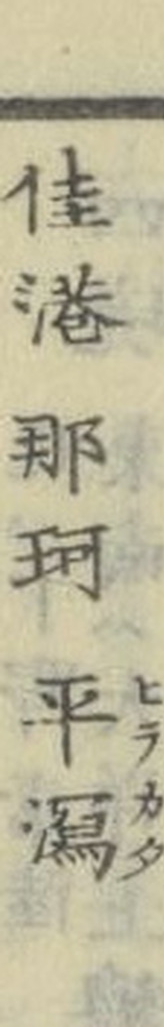佳港那珂平瀉
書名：下等小学日本地誌略図問答 巻上 畿内東海道之部
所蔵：University of the Ryukyus Library
